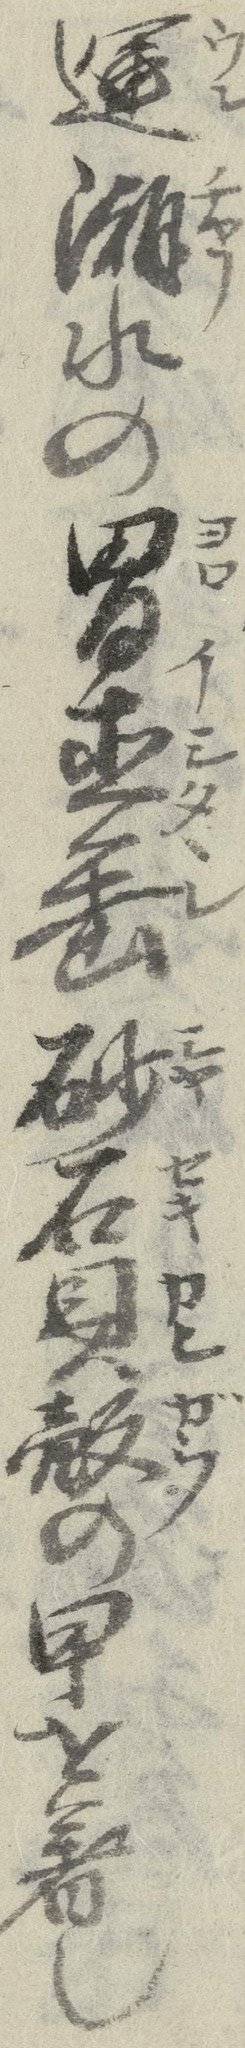運潮水の冑直垂砂石貝殻の甲を着し
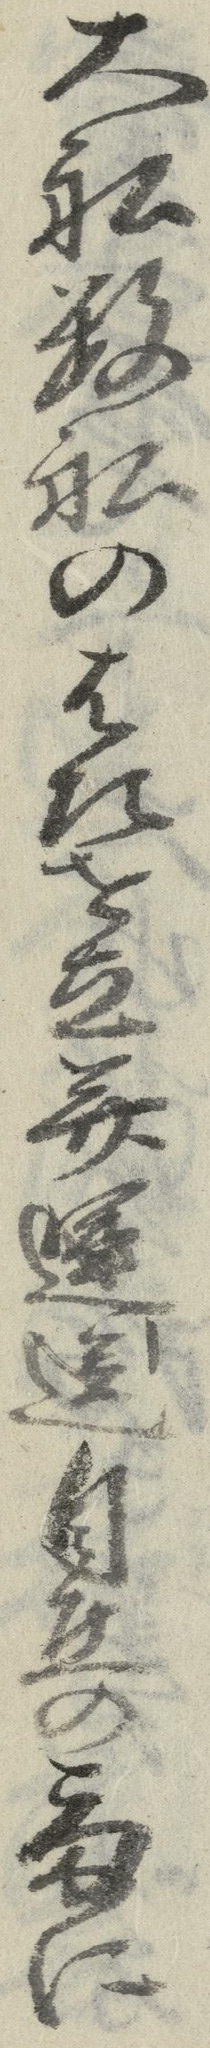大舩数舩のはたを立幷運送自在のこまに
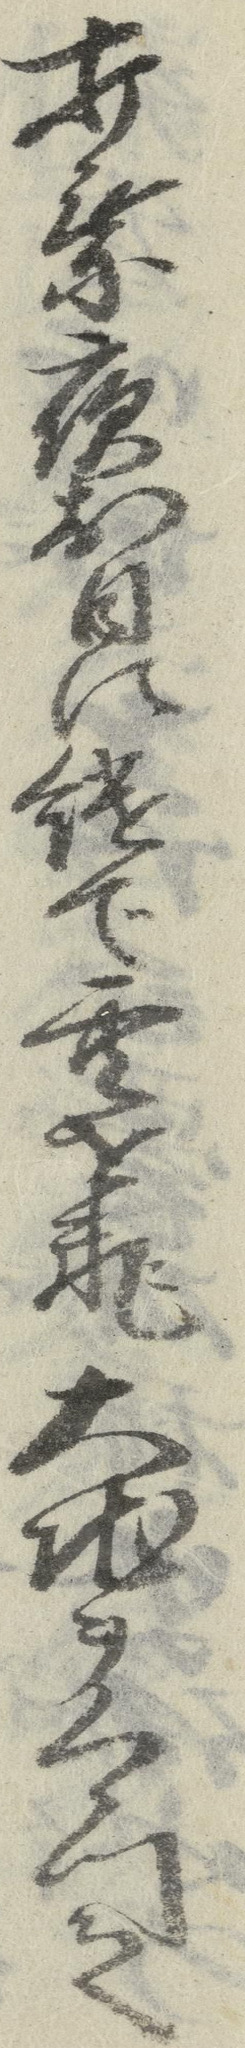打乗夜お日に継で空を飛大地ヲくゝつて
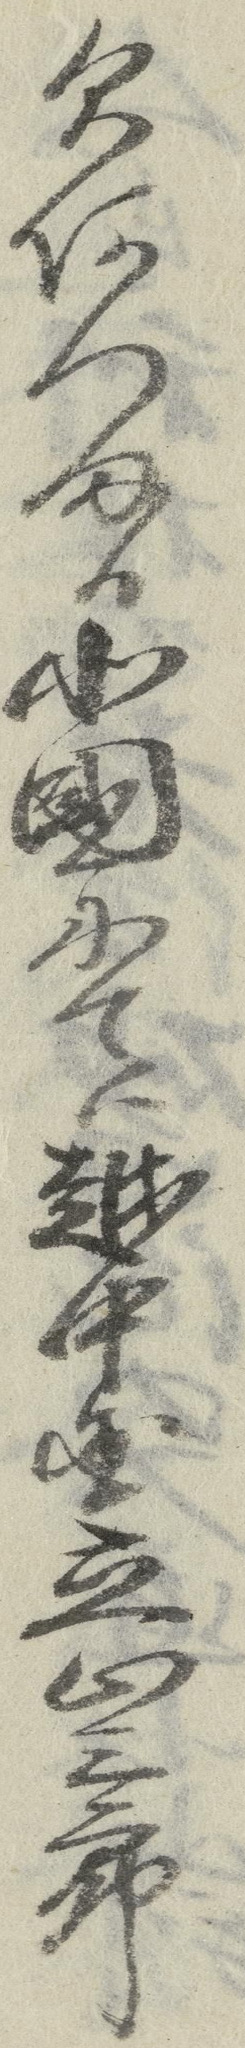欠あつまる北国にては越中国立山三郎
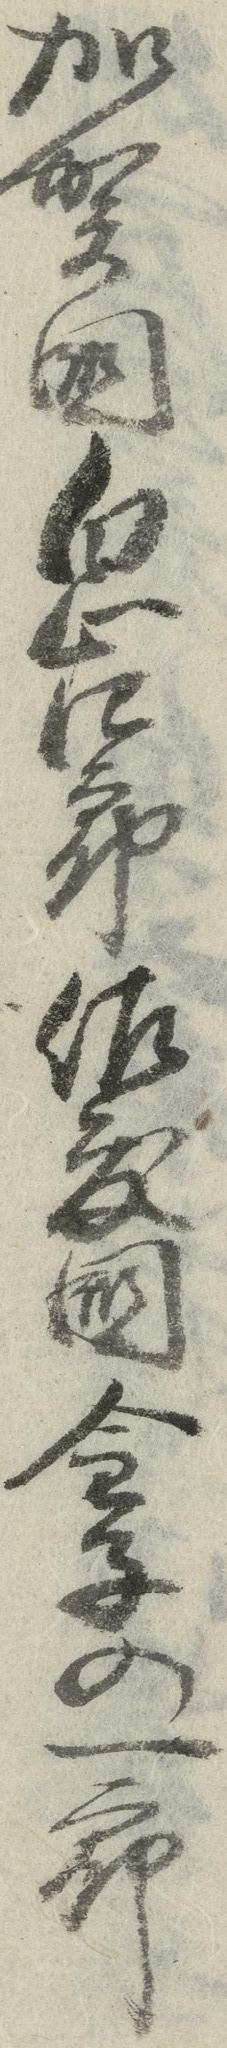加賀国白山四郎佐渡国金子の一郎
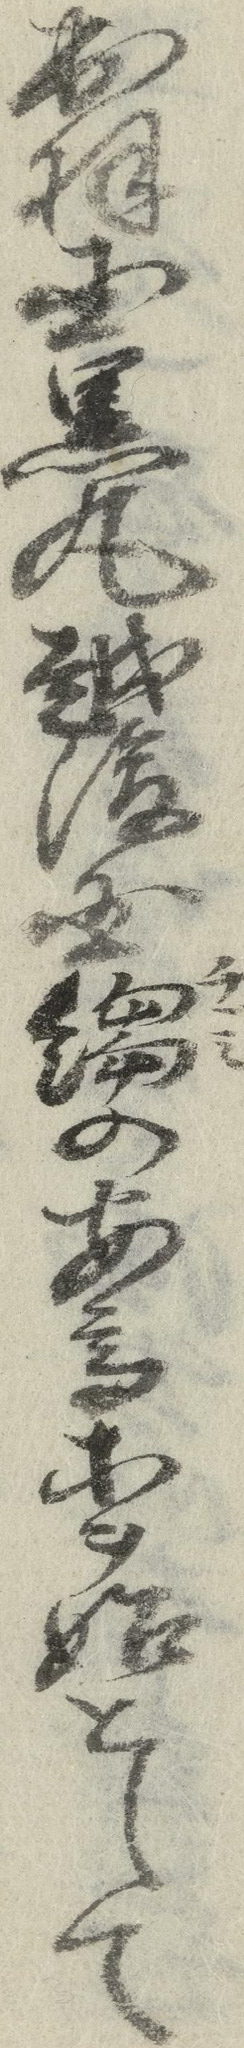出羽国黒丸越後国縐の安高等ヲ始として
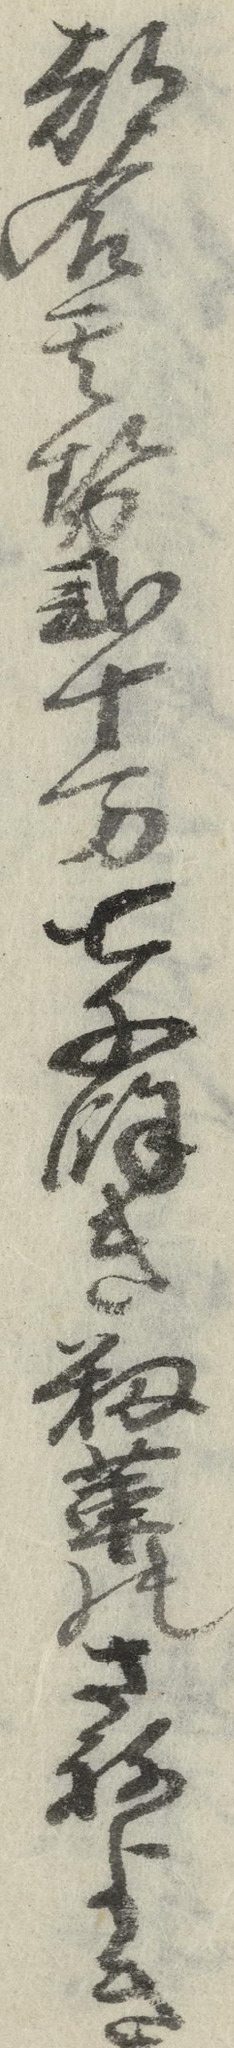都合其勢弐十万七千余き籾華のさねよき
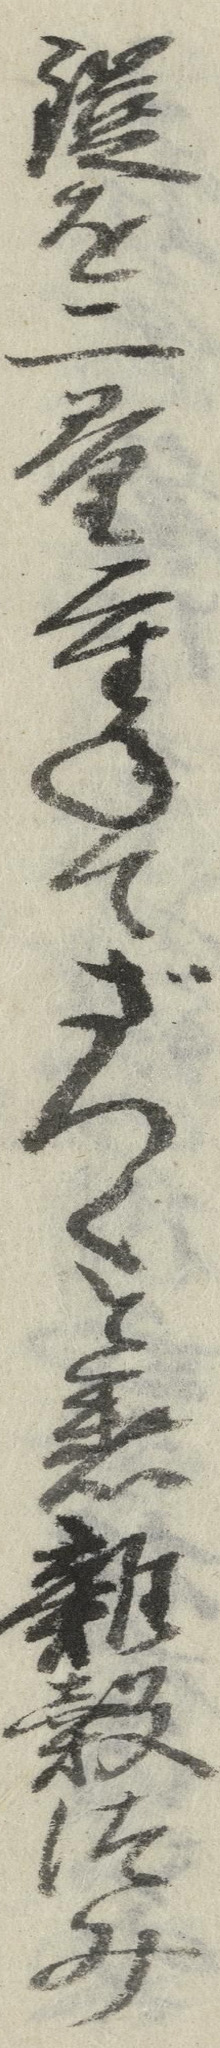鎧を二量重ねてざつくと着雑穀つみ
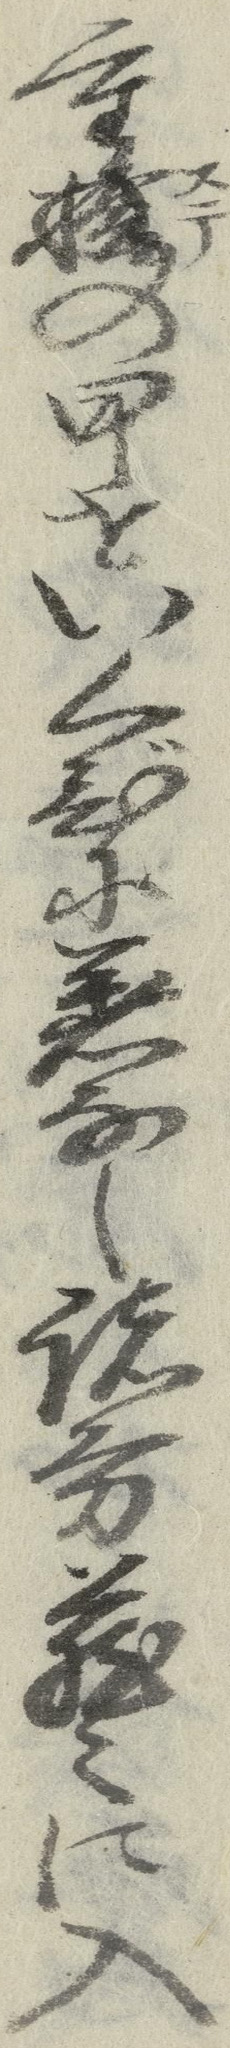重捨の甲をいくびに着なし諸方蔵々に入
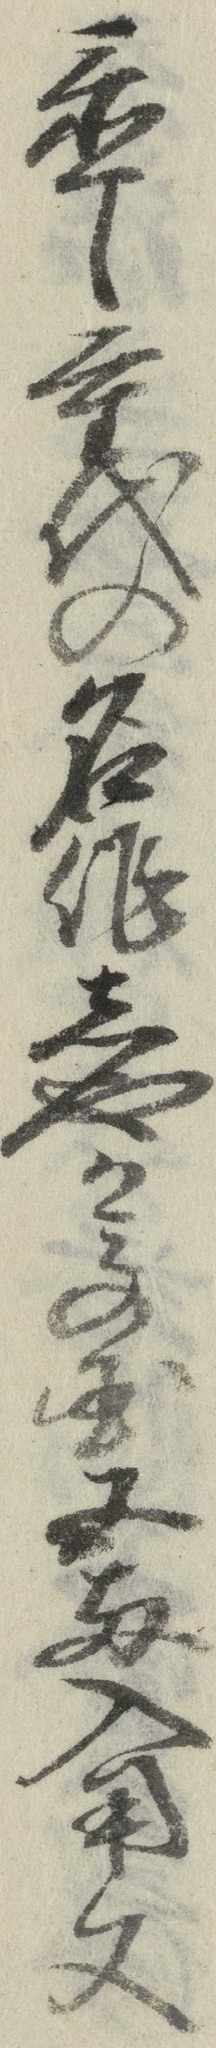置し重代の名作しやかみの国五両入用又

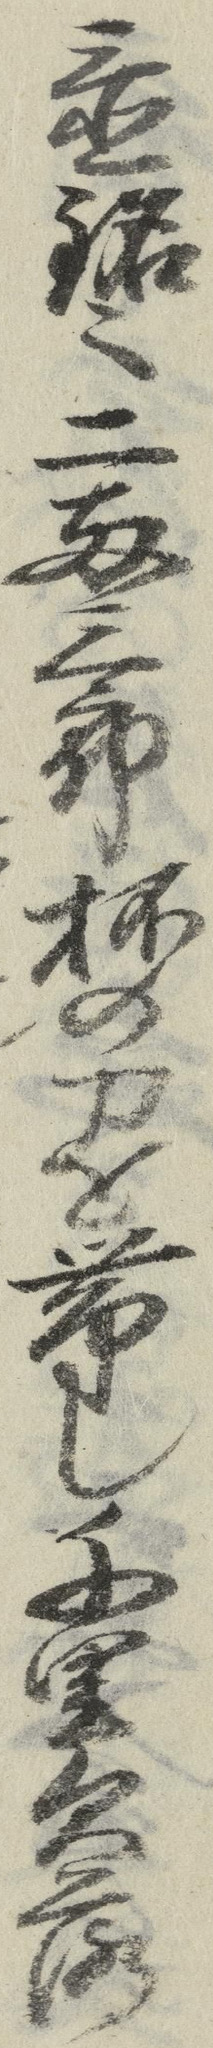置銘々二両三郎抔の刀を帯し千里欠落
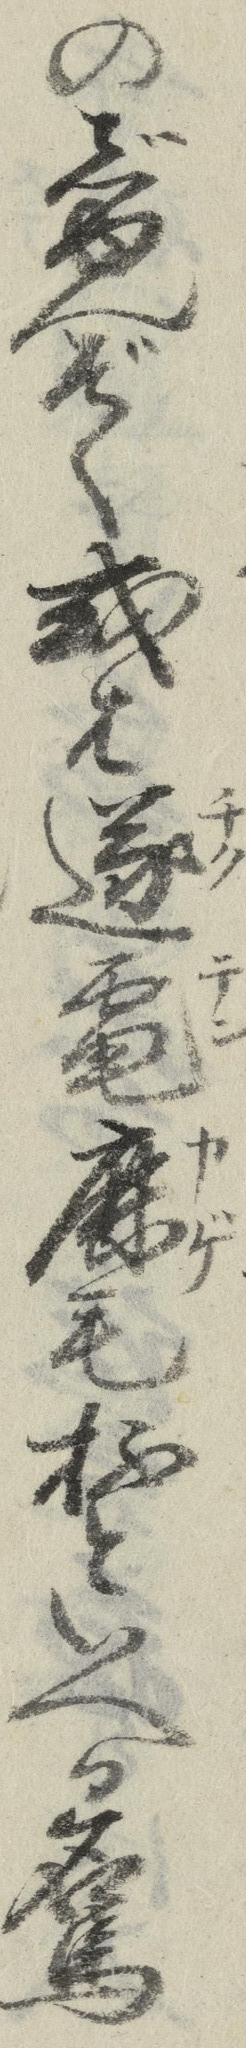のじゆんぞ〳〵或は遂電鹿毛抔といへる名馬
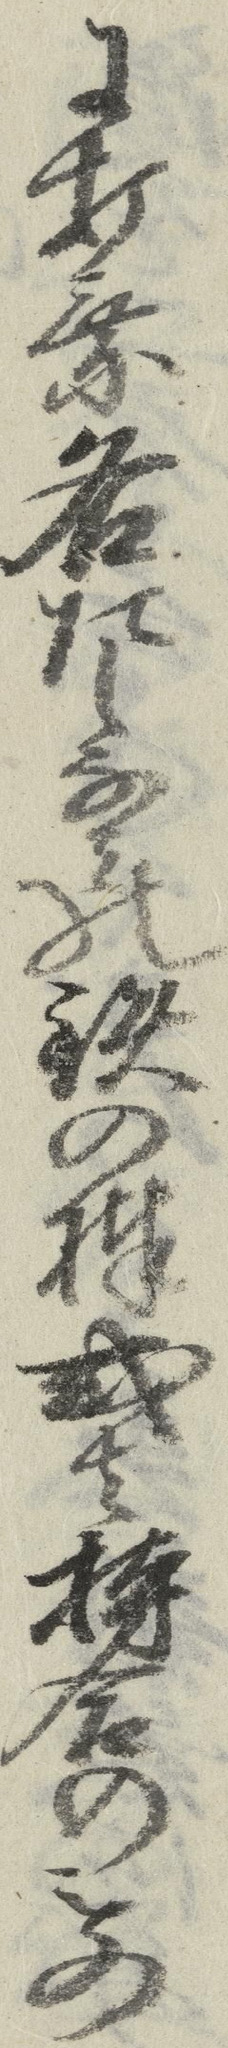に打乗各たしなみの鉄の棒或は持合のもの
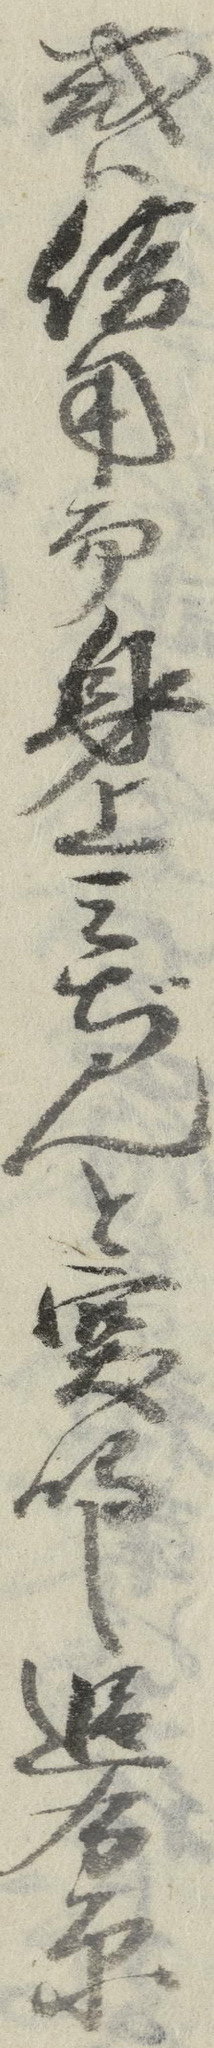或は借用而身上みぢんと突鳴し追分原
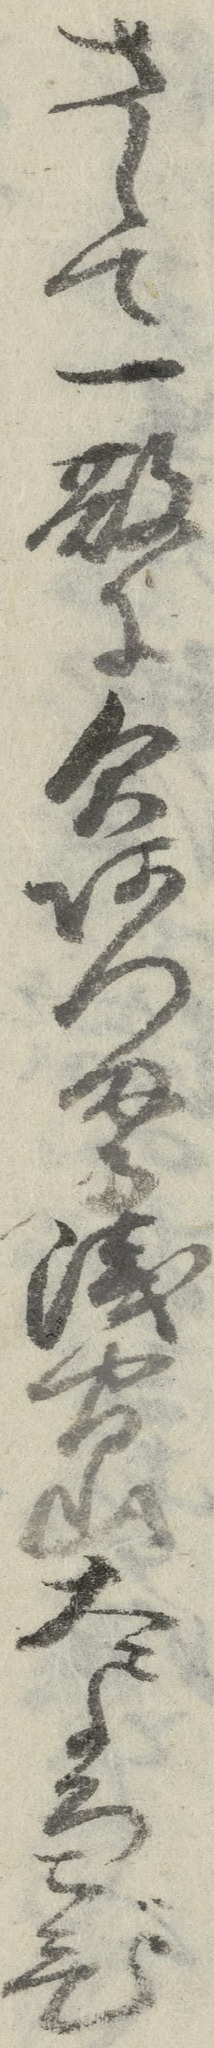さして一散に欠あつまる浅間山大によろこび
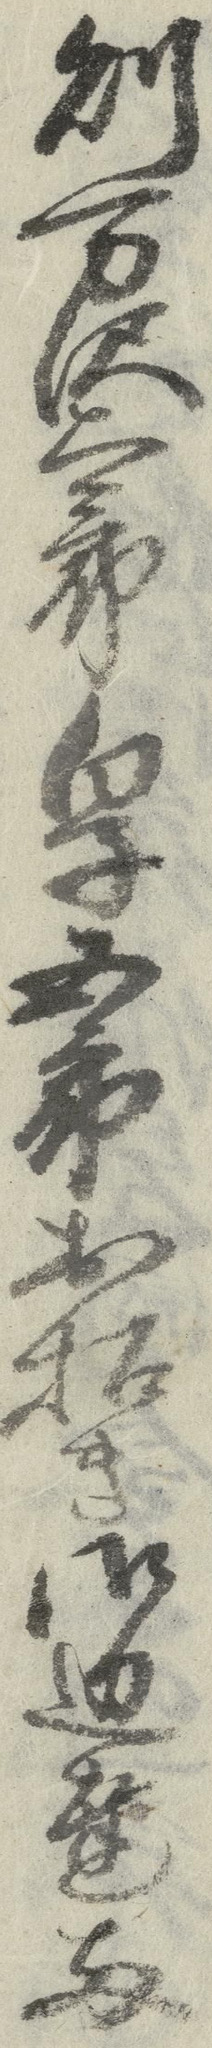則万沢太郎白子五郎お招き御辺達両
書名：浅間大焼騒動記　上
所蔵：東京大学地震研究所図書室 Earthquake Research Institute Library, The University of Tokyo, JAPAN
